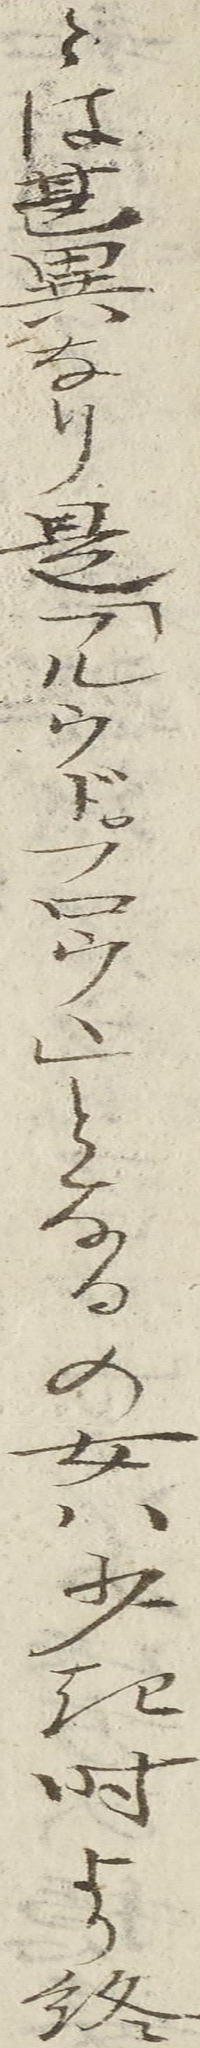とは甚異なり是「フルウド。ロウゝ」となるの女ハ少き時より終
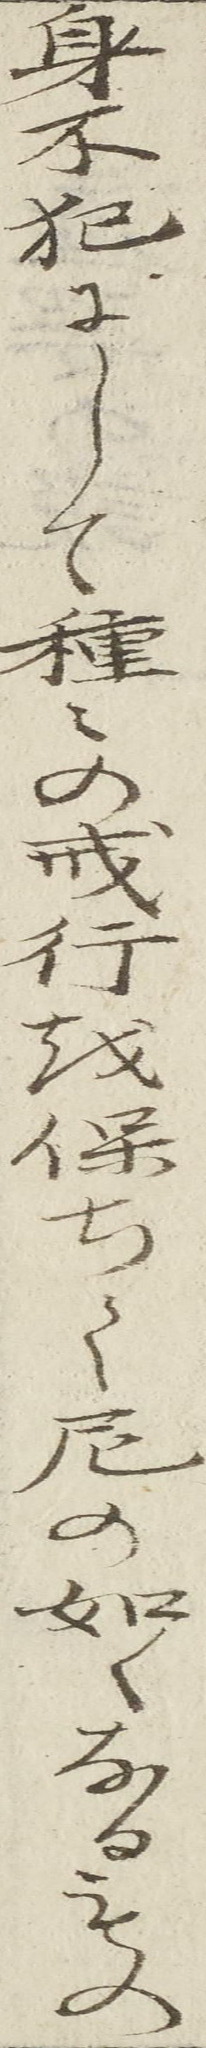身不犯にして種々の戒行を保ちて尼の如くなるもの
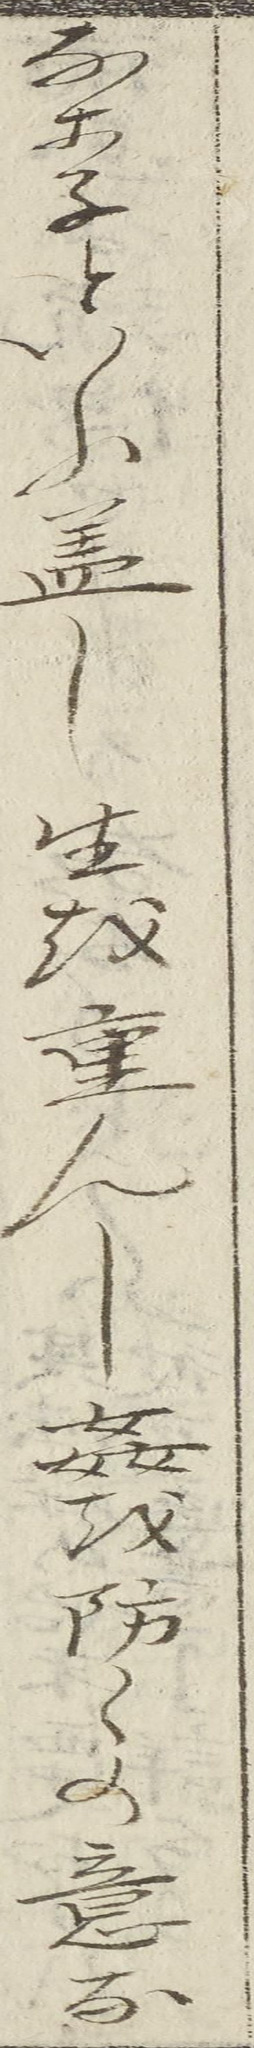なら子といふ蓋し生を重んし姦を防くの意な
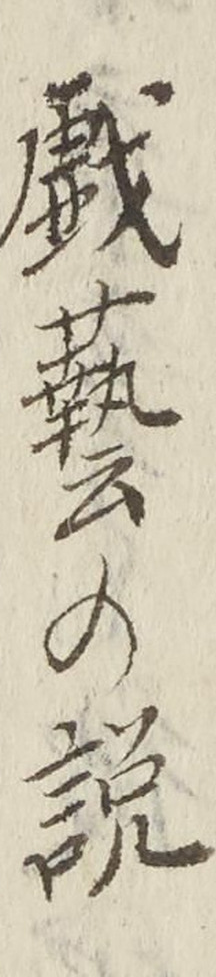戯芸の説
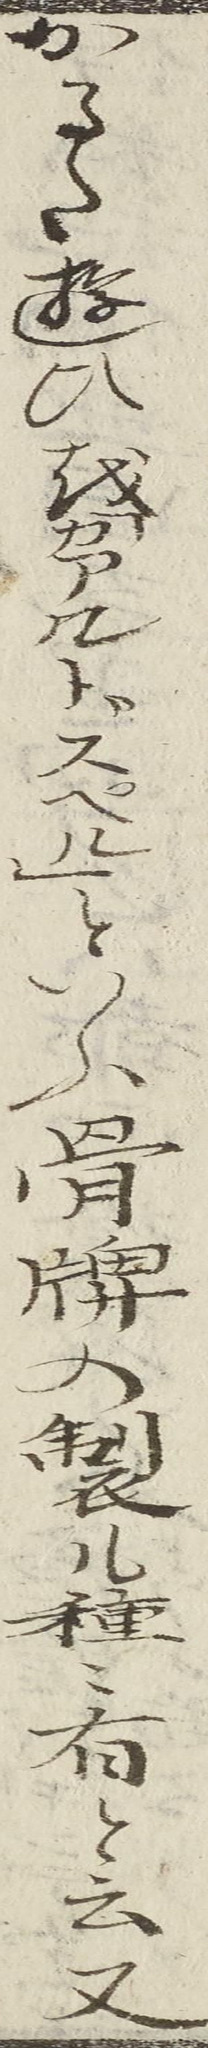かるた遊ひを「カアルト。スペル」といふ骨牌の製も種々有と云又
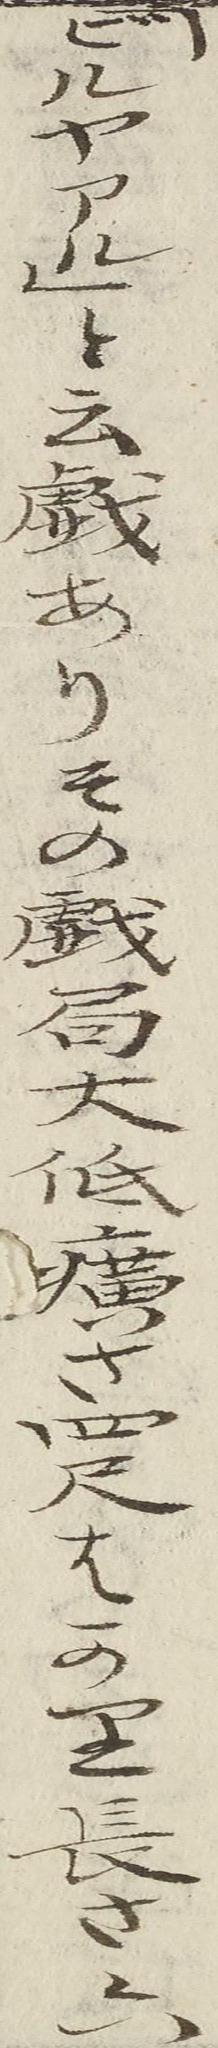「ビルやアル」と云戯ありその戯局大低廣さ四尺はかり長さ六
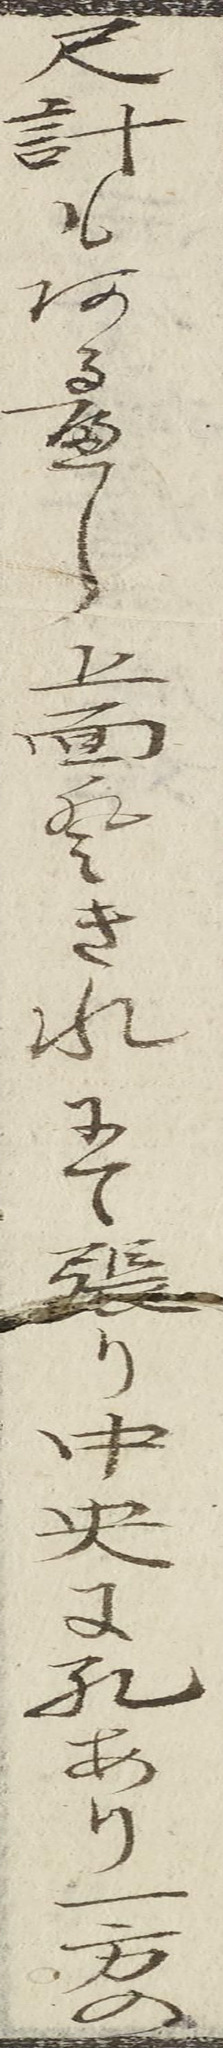尺計もあるへし上面はきれにて張り中央に孔あり一方の
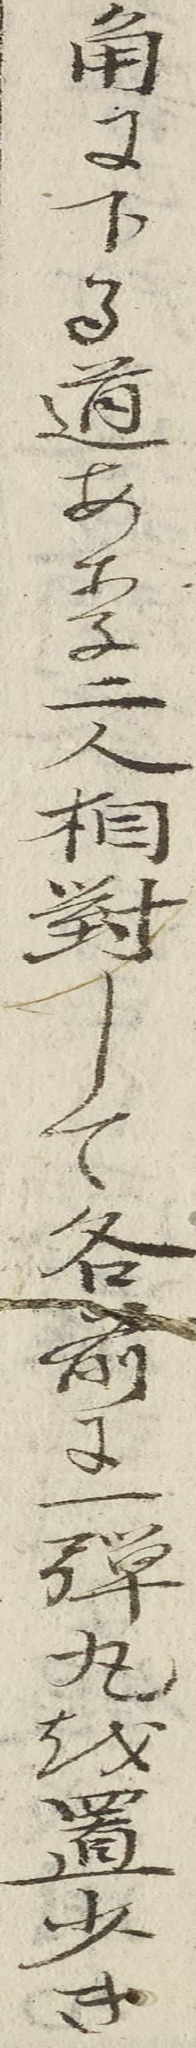角に下る道あら子二人相対して各前に一弾丸を置少き
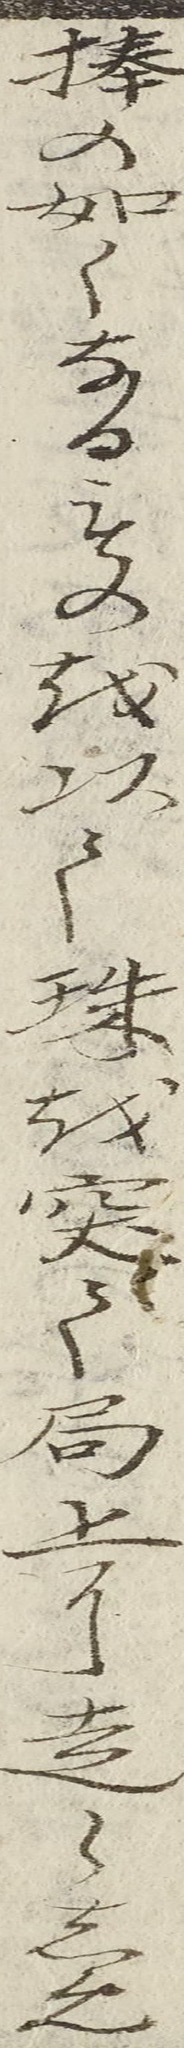棒の如くなるものを以て珠を突て局上に走らしめ
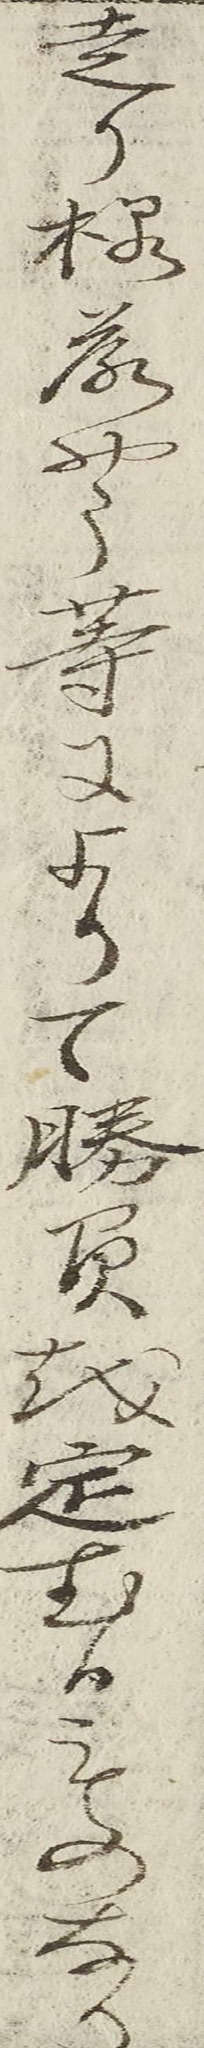走りサマ落やう等によりて勝負を定むるものなり
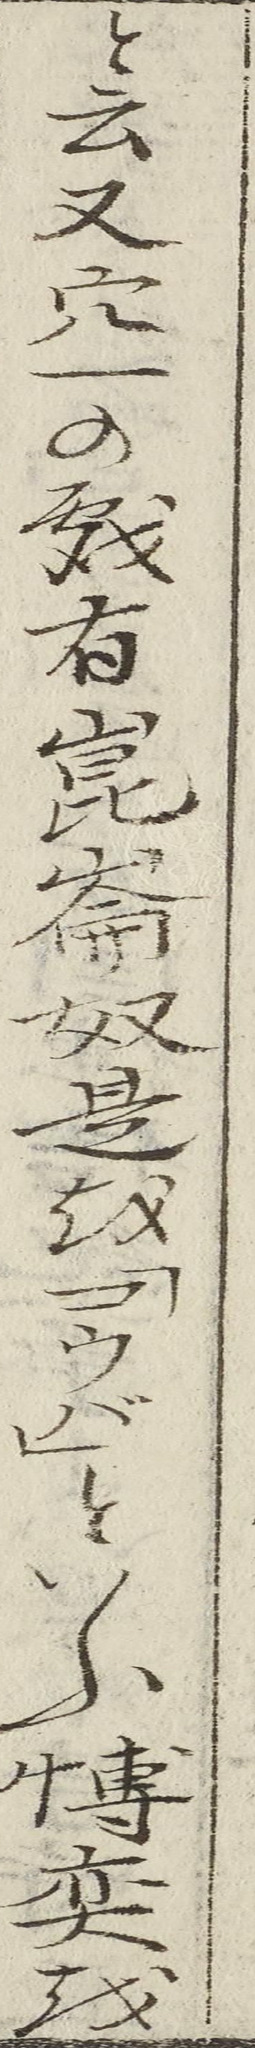と云又穴一の残あり崑崙奴是を「コウバ」といふ博奕を
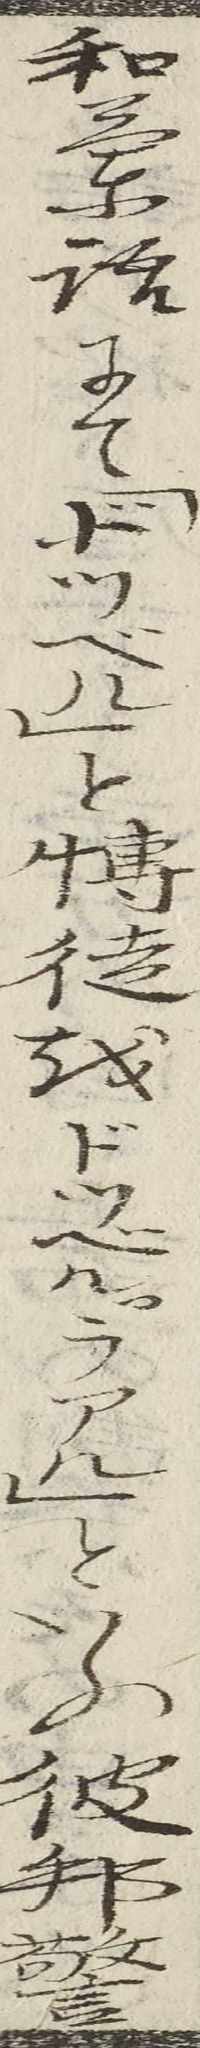和蘭説にて「ドツベル」と博徒をドッベル。ラアる」といふ彼邦警
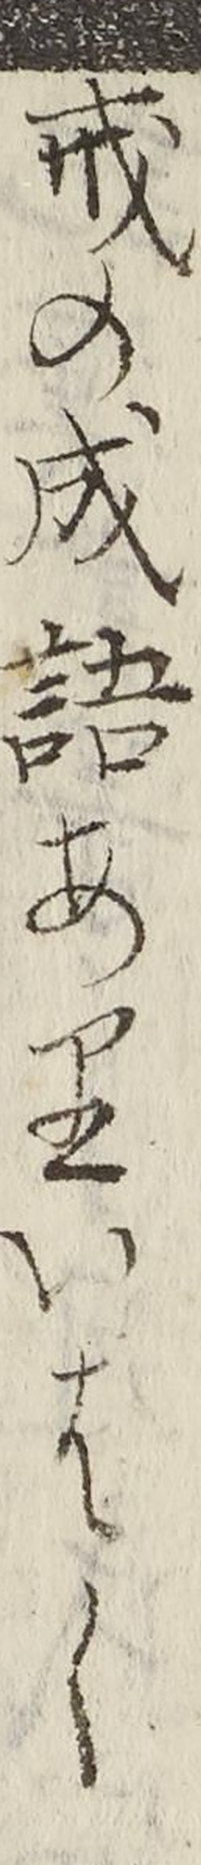戒の成語ありいはく
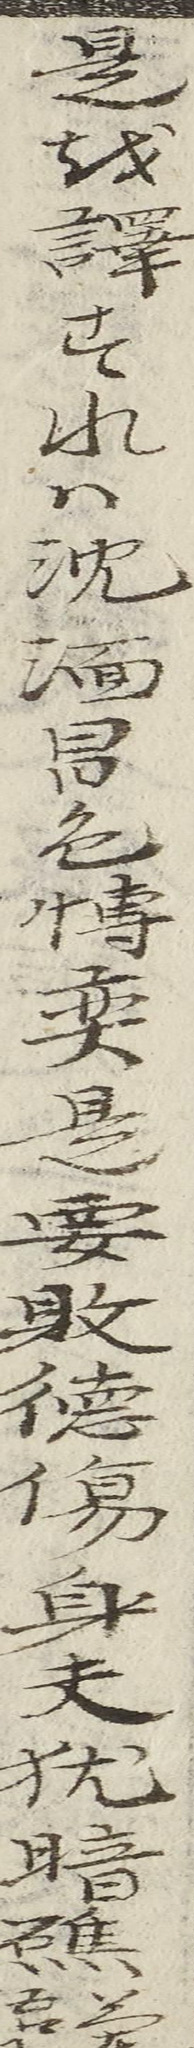是を訳すれハ沈湎冒色博奕是要敗徳傷身夫犹暗礁蘭語に
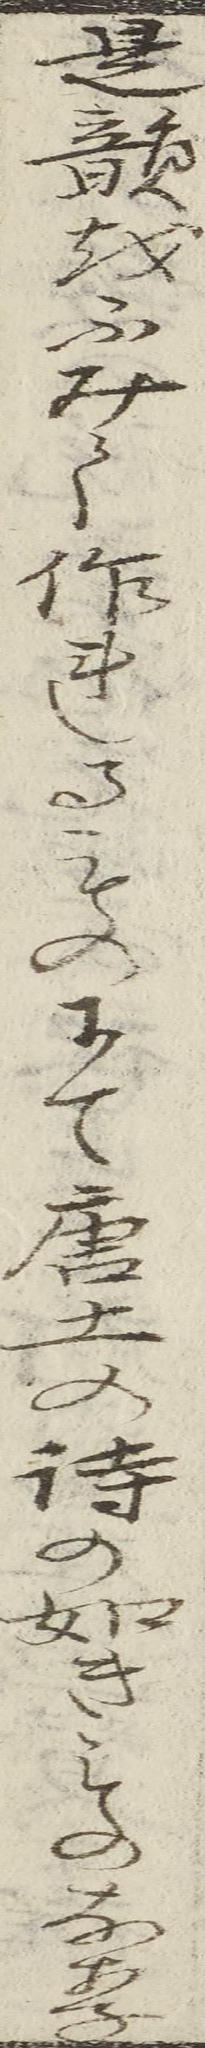是龍をふみて作れるものにて唐土の詩の如きものなら子

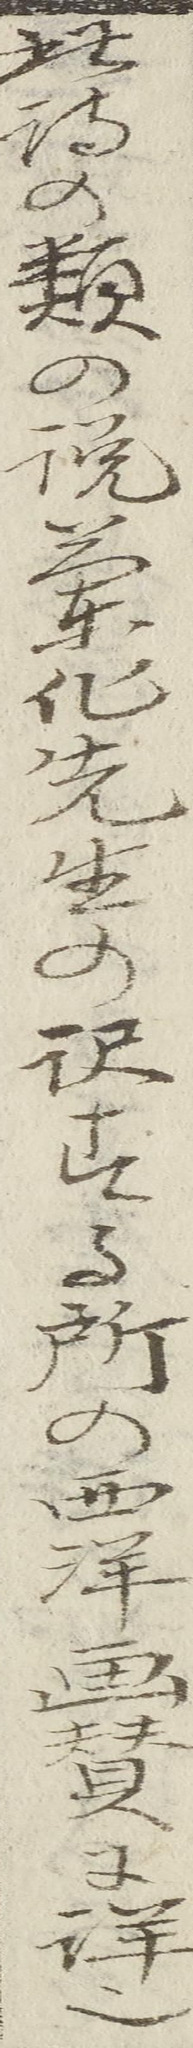此詩の類の説蘭化先生の訳する所の西洋画賛に詳也
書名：西洋雜記　坤
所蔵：東京大学地震研究所図書室 Earthquake Research Institute Library, The University of Tokyo, JAPAN
